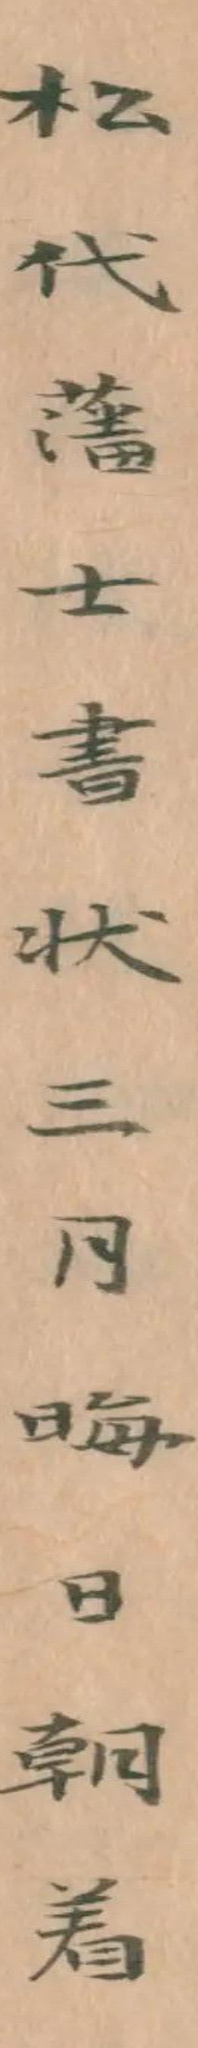松代藩士書状三月晦日朝着
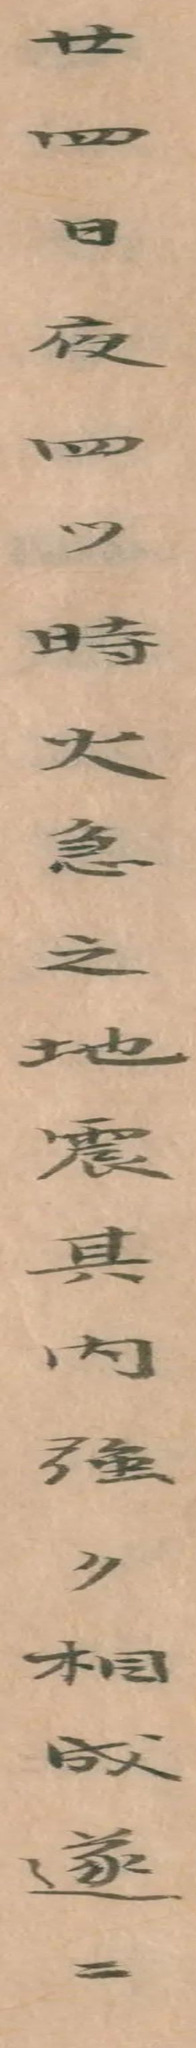廿四日夜四ツ時火急之地震其内強ク相成遂二
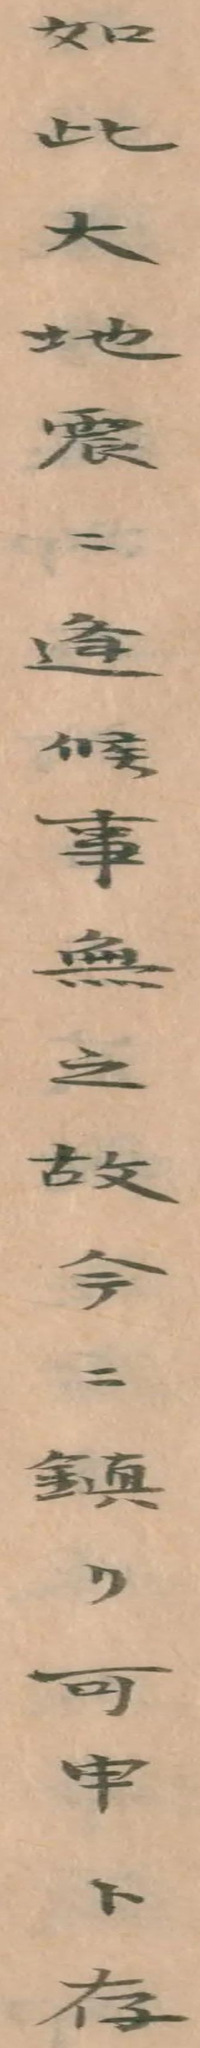如此大地震二逢候事無之故今二鎮り可申ト存
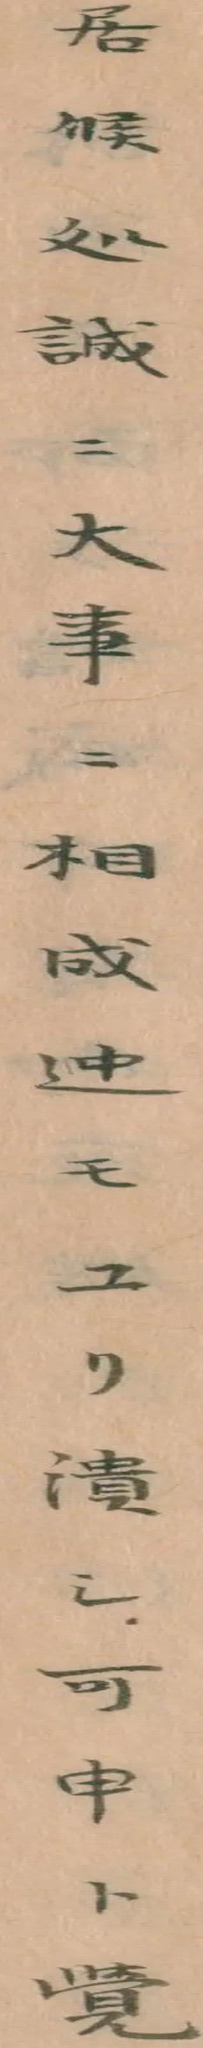居候処誠二大事二相成迚モユリ潰シ可申ト覚
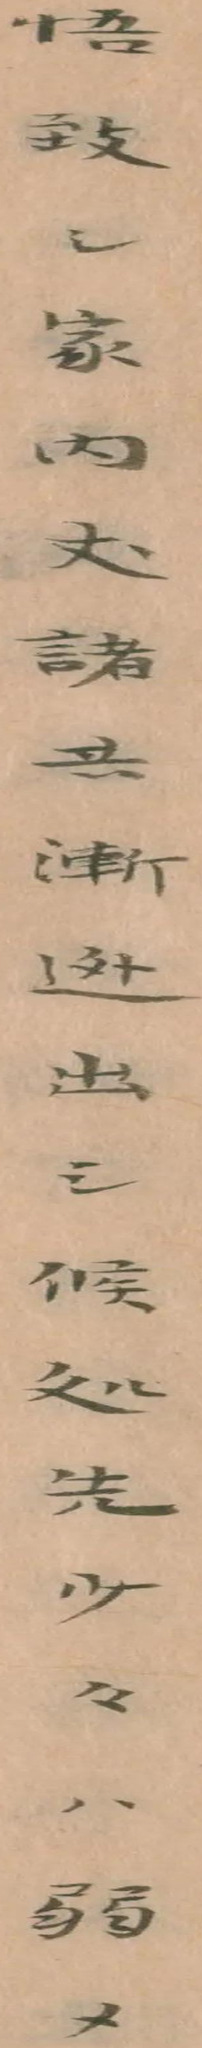悟致シ家内丈諸共漸逃出シ候処先少々ハ弱メ
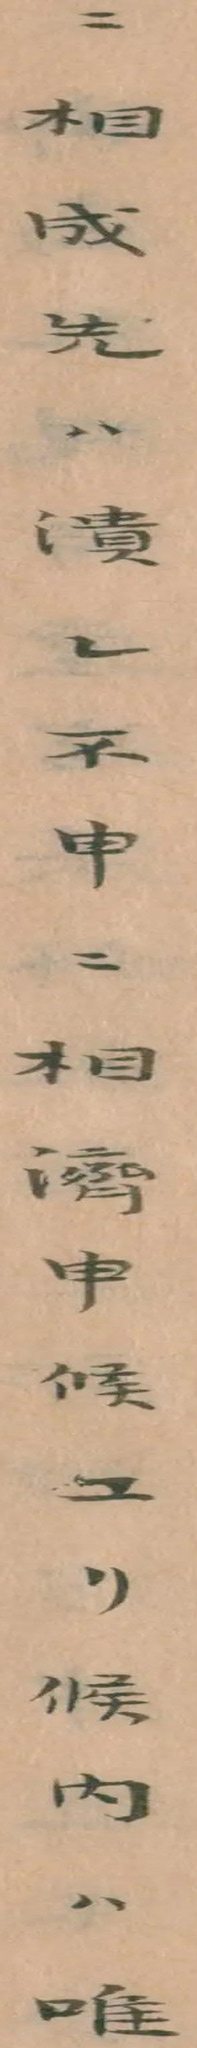二相成先ハ潰レ不申二相済申候ユリ候内ハ唯
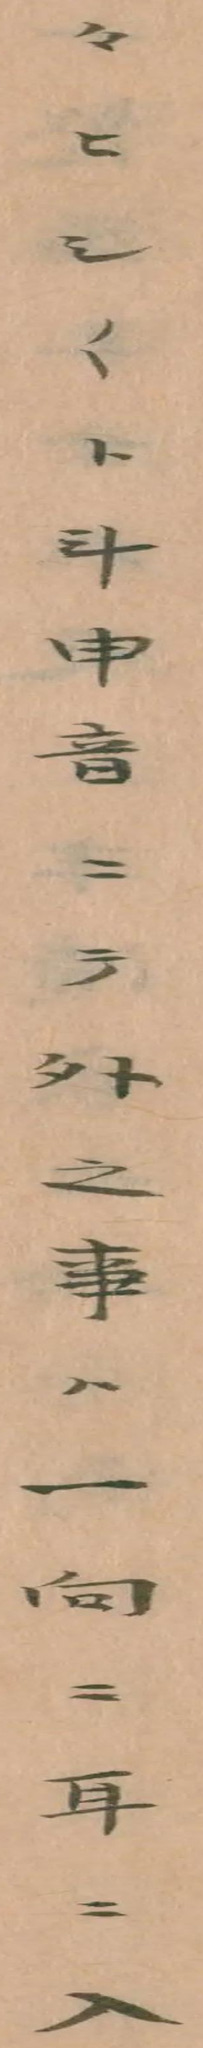々ヒシ〳〵ト斗申音二テ外之事ハ一向二耳二入
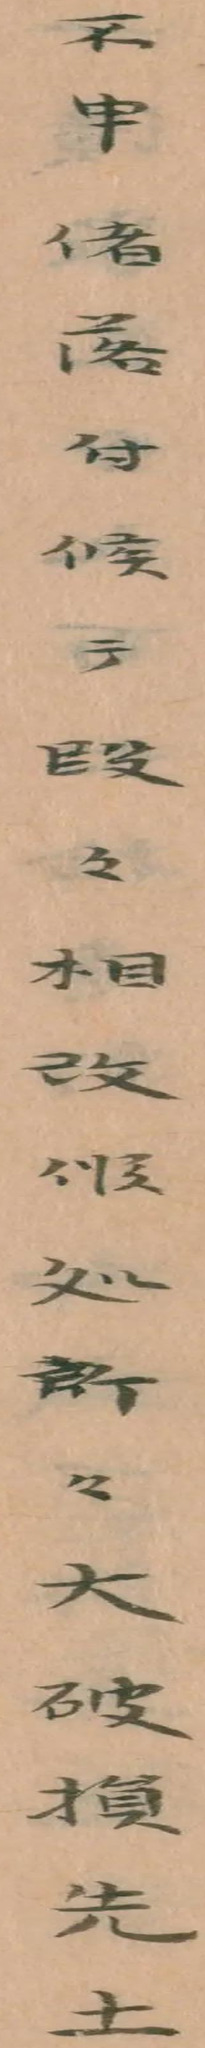不申偖落付候テ段々相改候処所々大破損先土
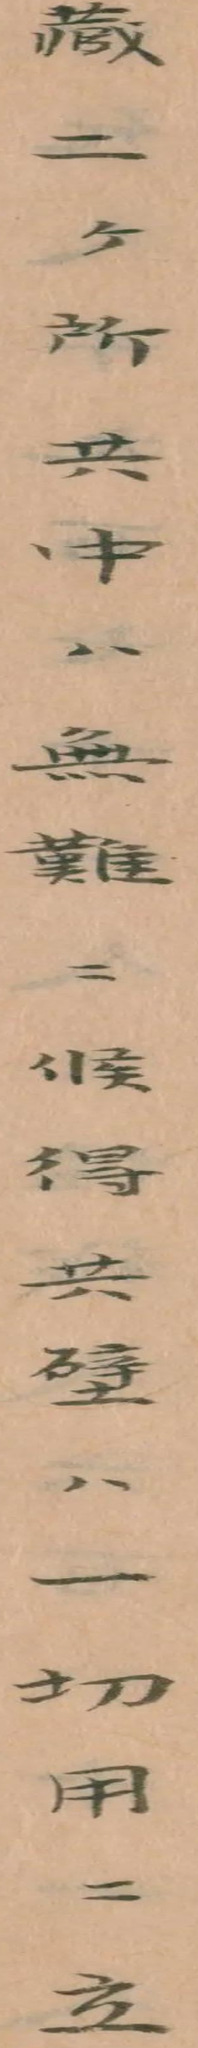蔵二ヶ所共中ハ無難二候得共壁ハ一切用二立
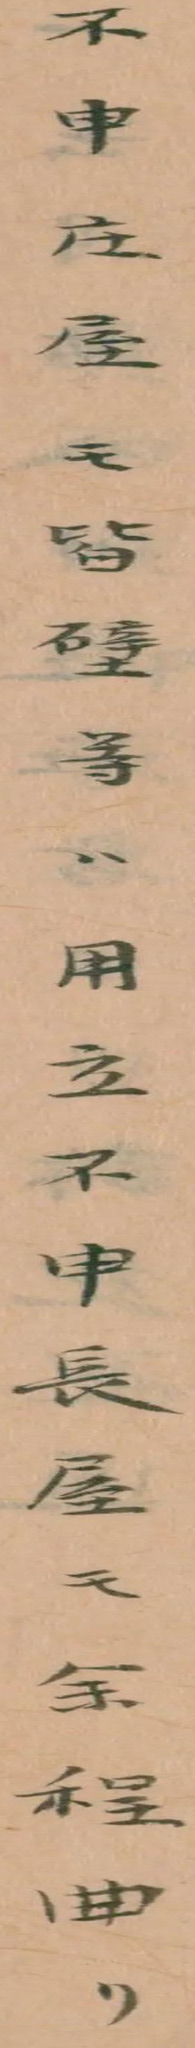不申庄屋モ皆壁等ハ用立不申長屋モ余程曲リ
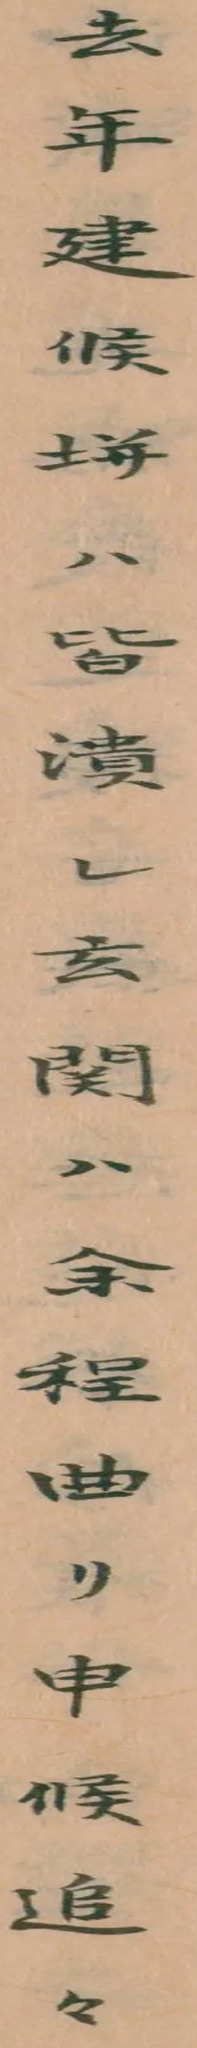去年建候塀ハ皆潰レ玄関ハ余程曲リ申候追々
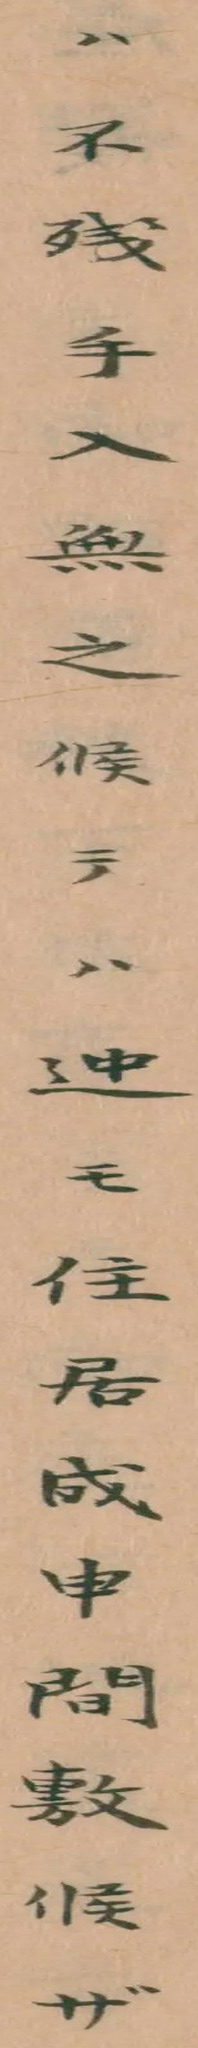ハ不残手入無之候テハ迚モ住居成申間敷候ザ
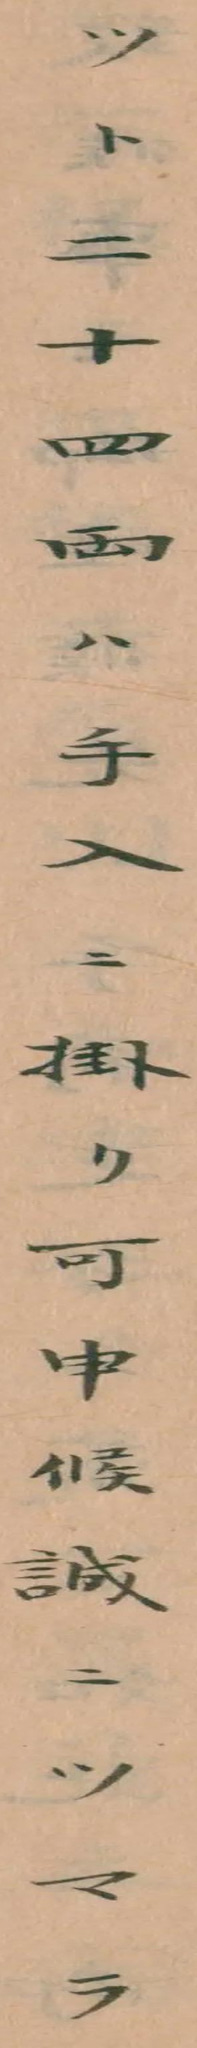ット二十四両ハ手入二掛り可申候誠二ツマラ
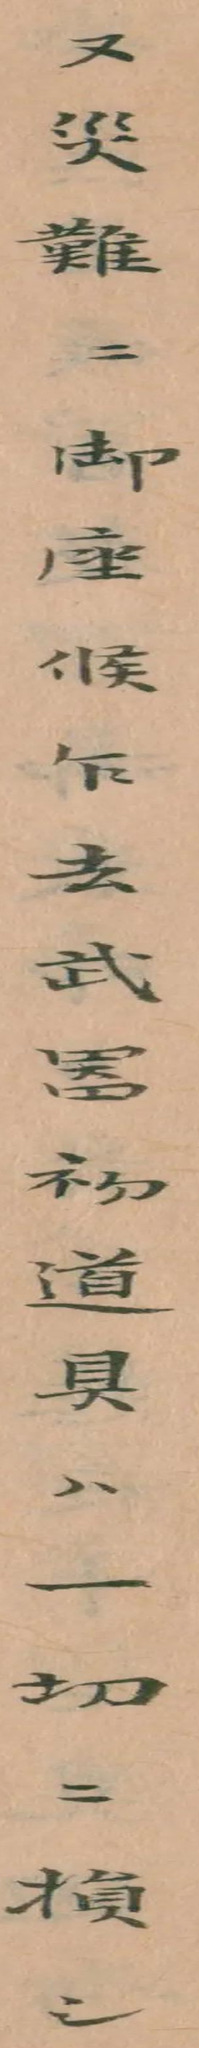ヌ災難二御座候乍去武器初道具ハ一切二損シ
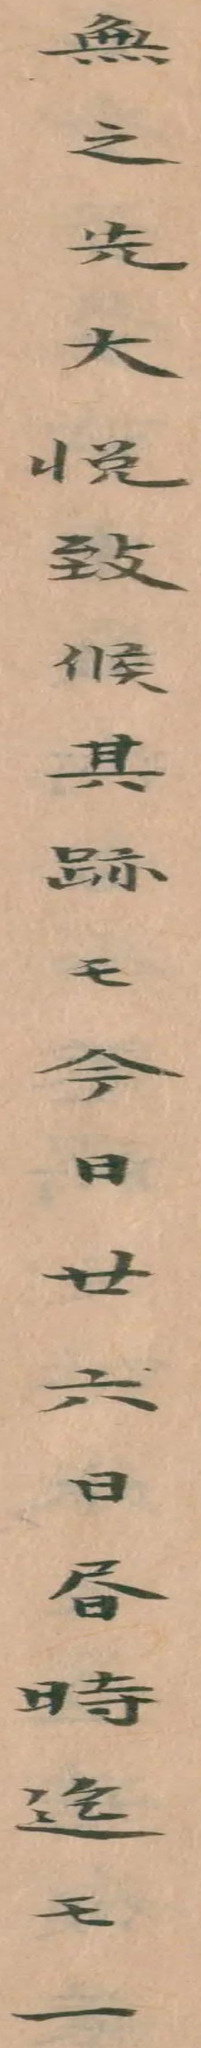無之先大悦致候其跡モ今日廿六日昼時迄モ一
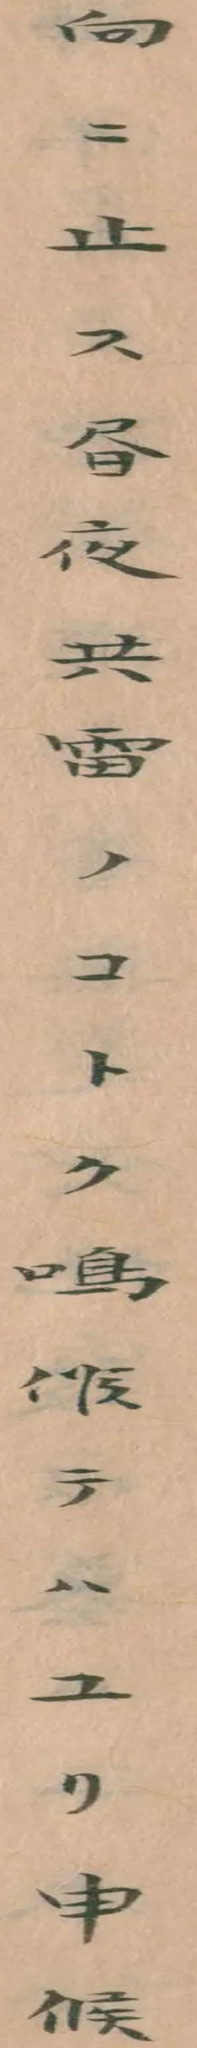向二止ス昼夜共雷ノコトク鳴候テハユリ申候
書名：地災撮要. 巻1(噴火山・地震ノ部)
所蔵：国立国会図書館 National Diet Library, JAPAN
